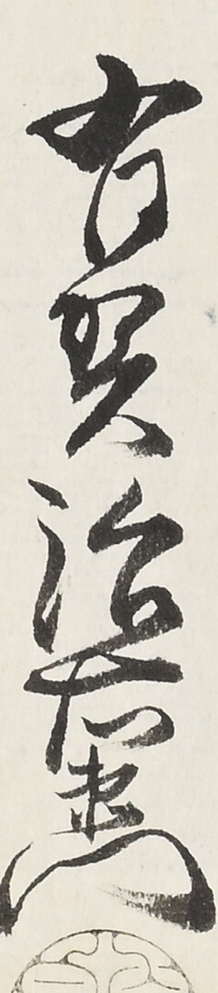有賀治右衛門㊞
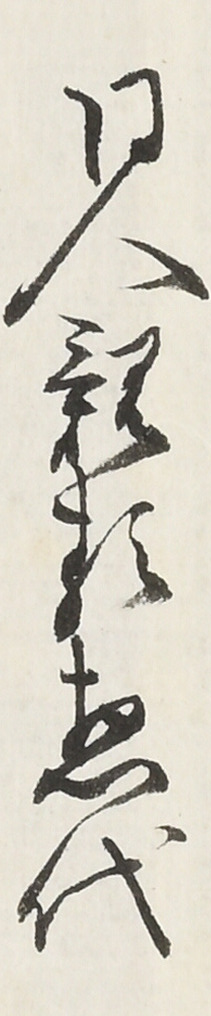同人親類惣代
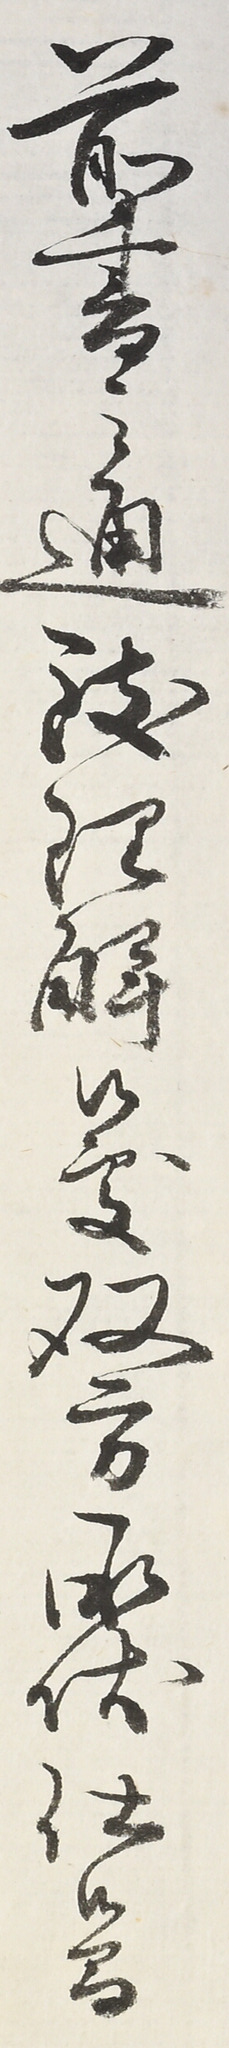前書之通致理解候処双方承伏仕候間
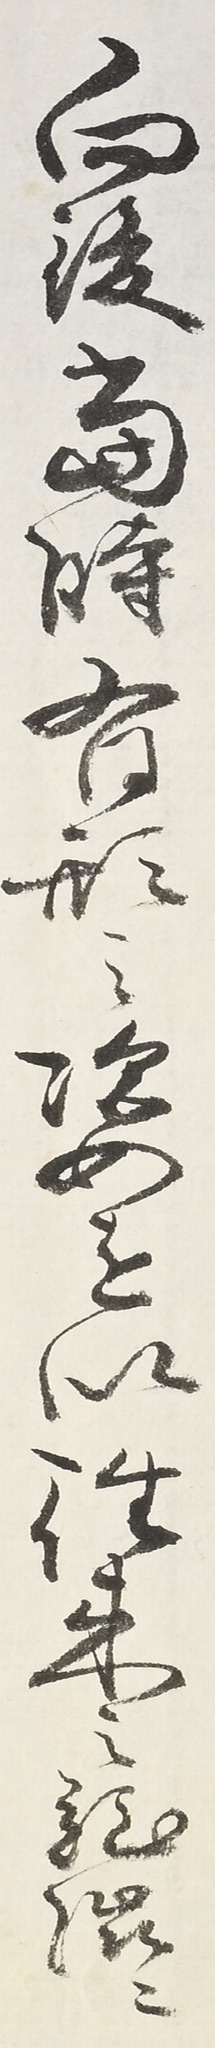向後当時有形之姿を以往来之難渋ニ
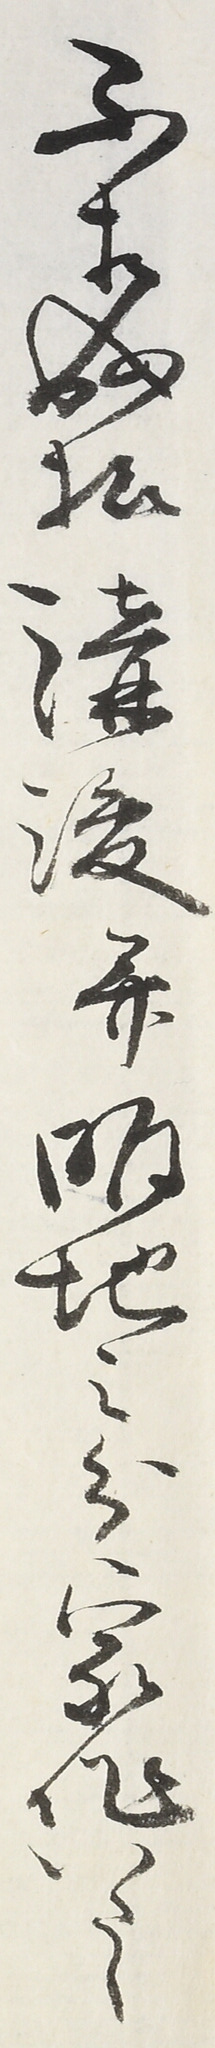不相成様溝浚并明地之分家作いたし
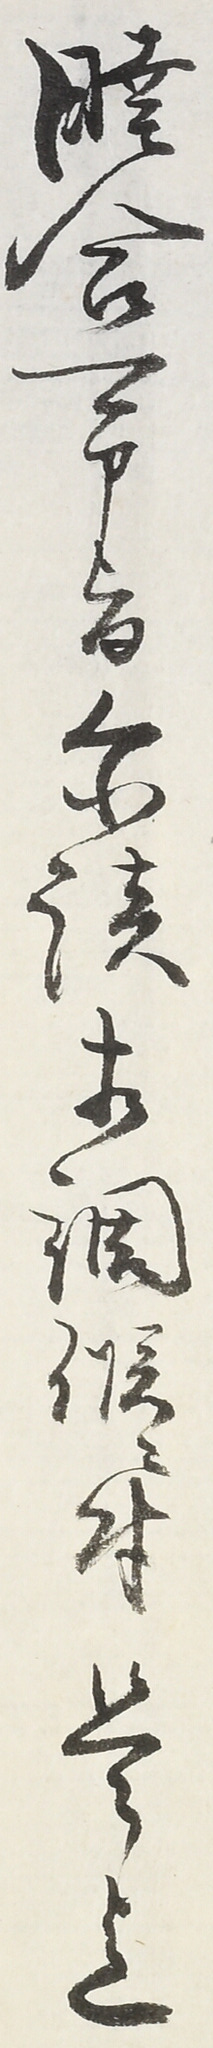睦合可申旨示談相調候ニ付是迄
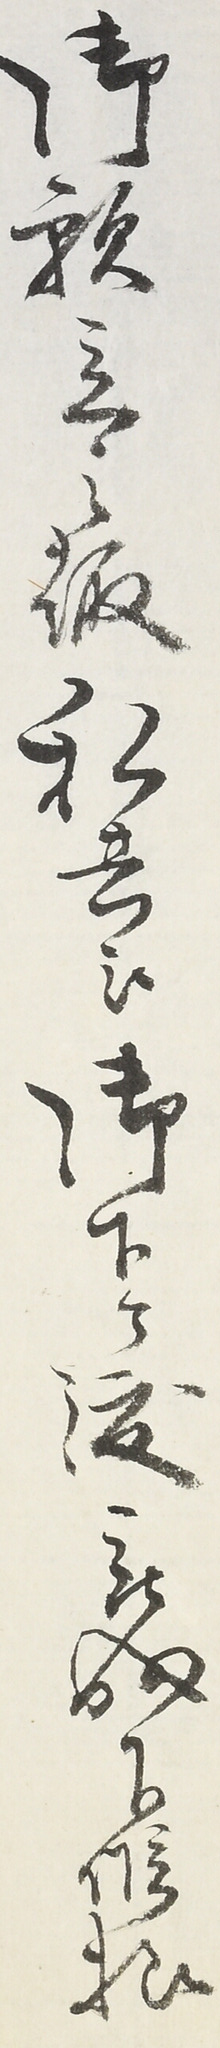御願立之趣私共江御下ヶ渡被成下候様
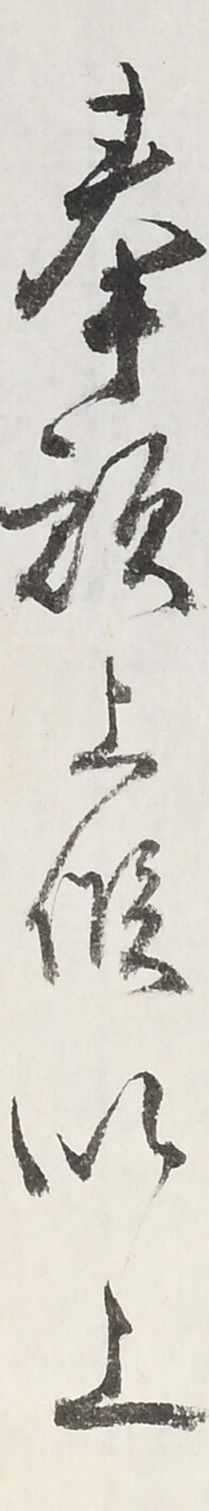奉願上候以上
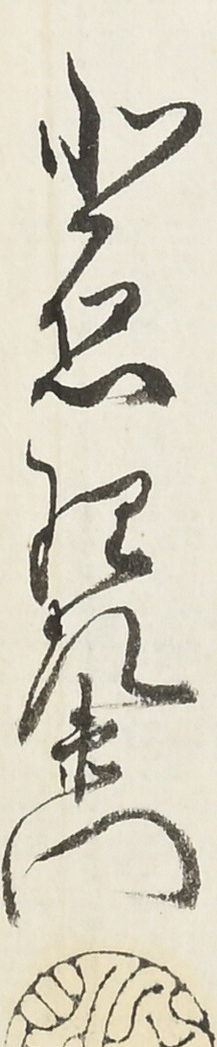北原理左衛門㊞
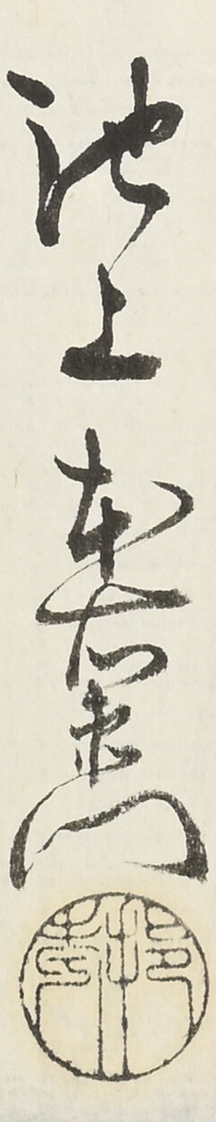池上本右衛門㊞
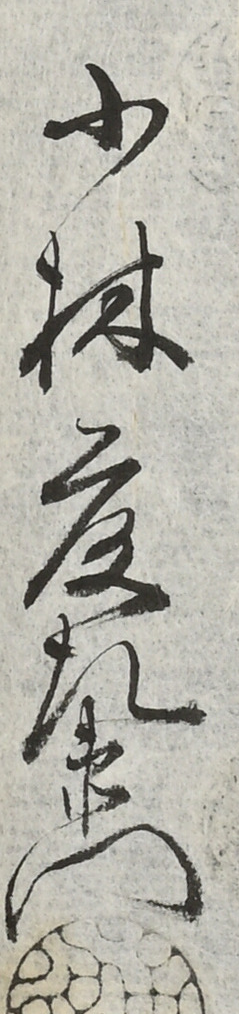小林藤左衛門㊞

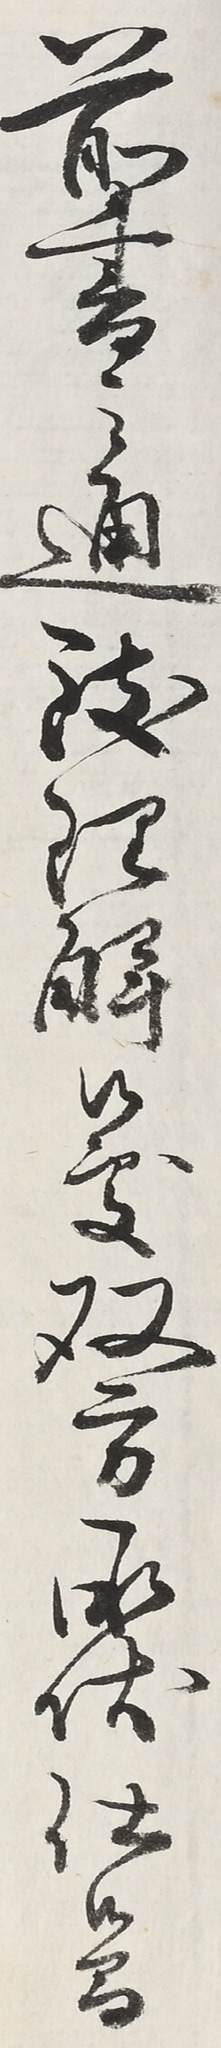前書之通致理解候処双方承伏仕候間
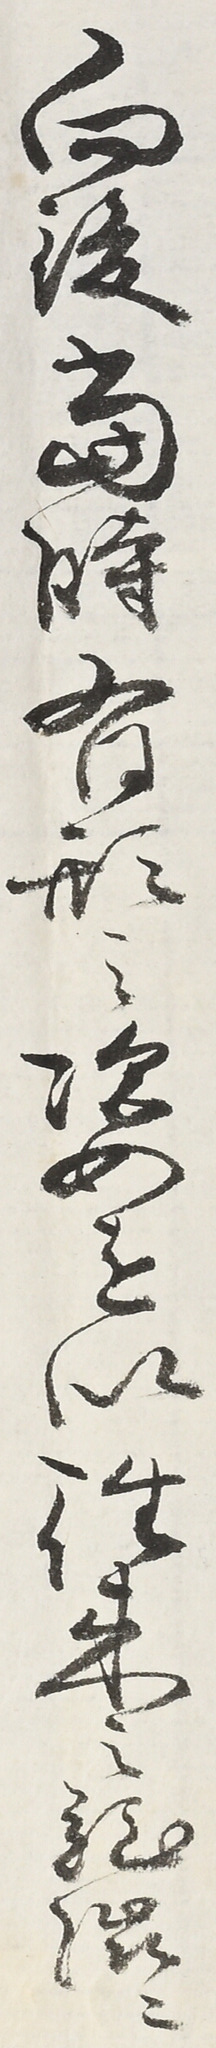向後当時有形之姿を以往来之難渋ニ
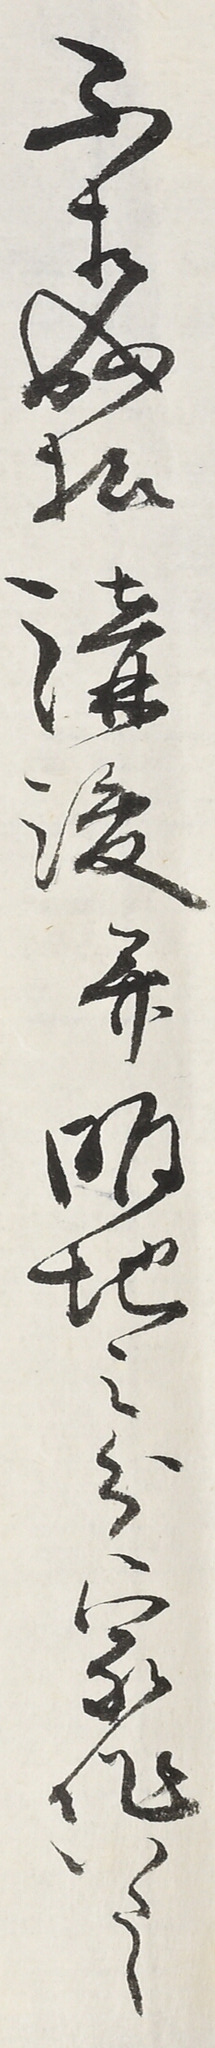不相成様溝浚并明地之分家作いたし
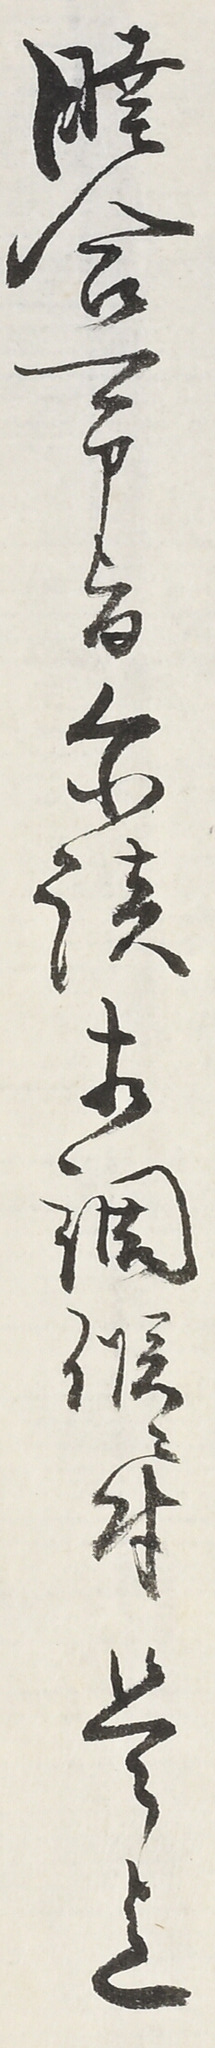睦合可申旨示談相調候ニ付是迄
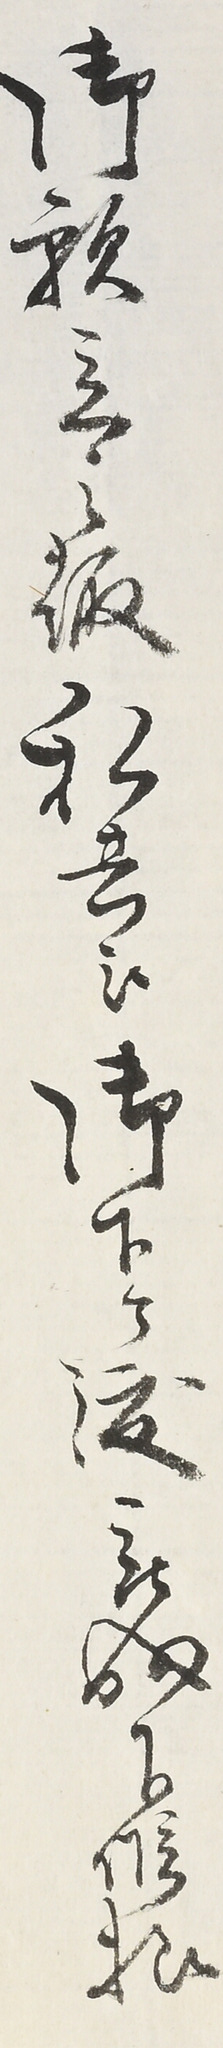御願立之趣私共江御下ヶ渡被成下候様
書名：為取替一札之事
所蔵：伊那市立高遠町図書館・合同会社AMANE
